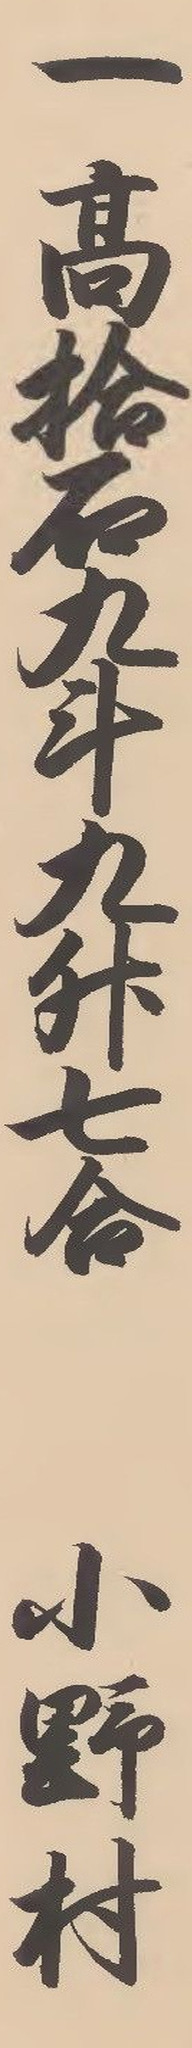一高拾石九斗九升七合小野村
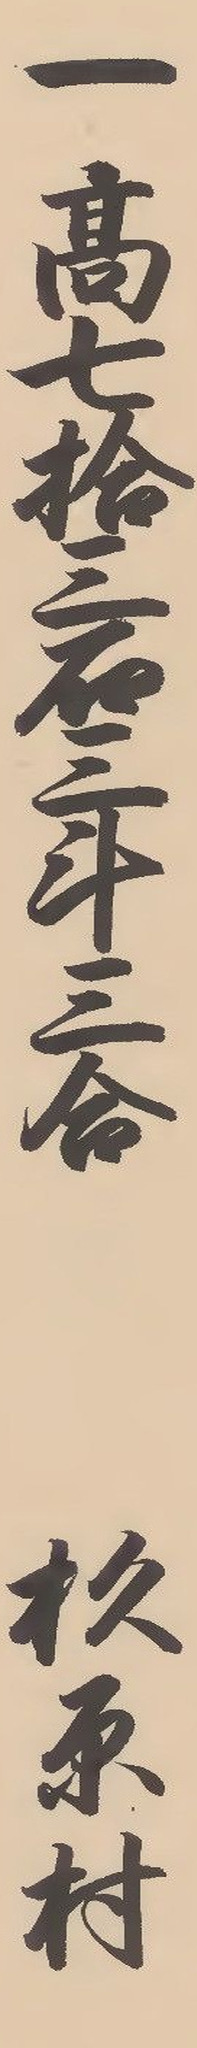一高七拾三石三斗三合杉原村
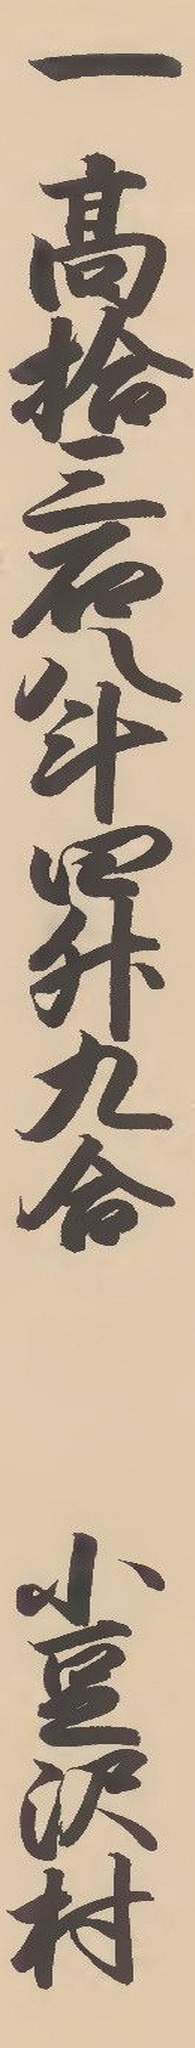一高拾三石八斗四升九合小豆沢村
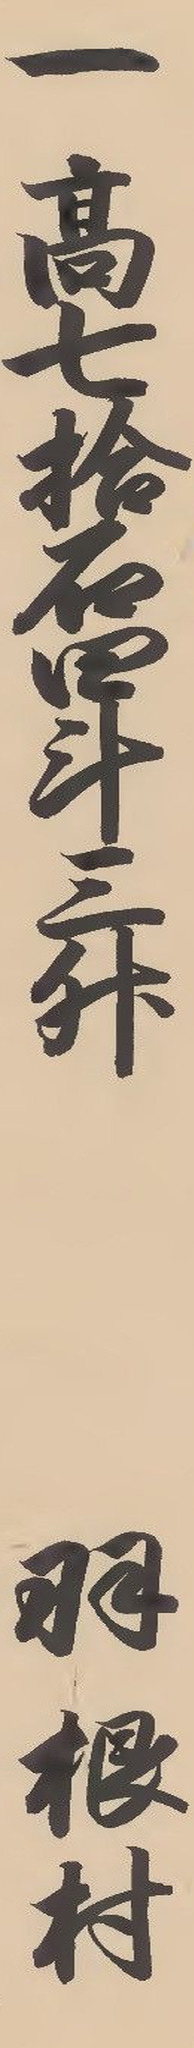一高七拾石四斗三升羽根村
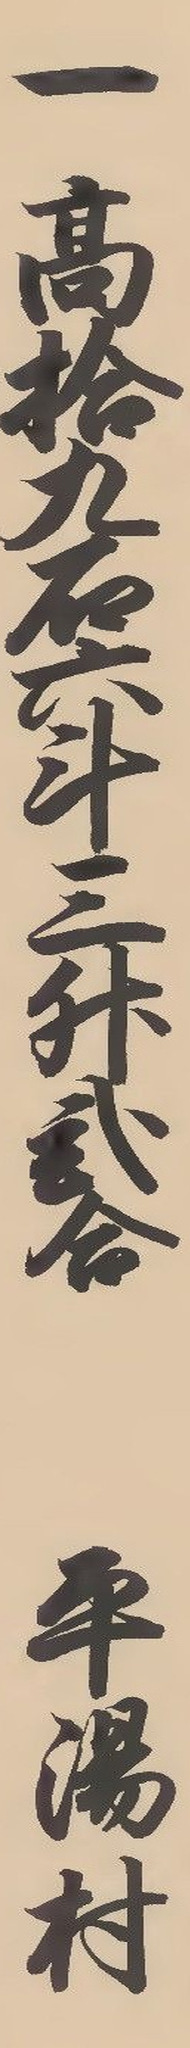一高拾九石六斗三升弐合平湯村
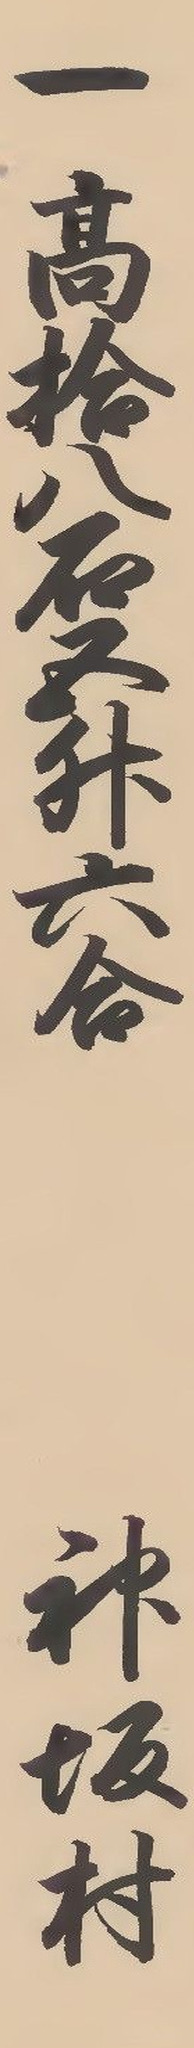一高拾八石五升六合神坂村
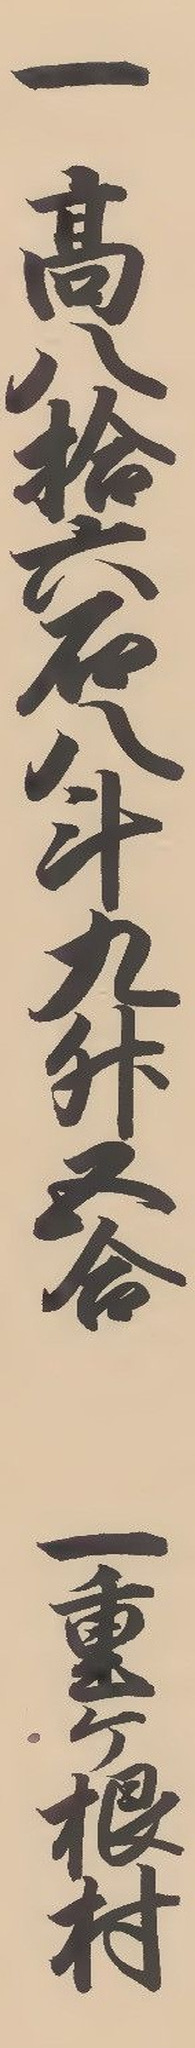一高八拾六石八斗九升五合一重ヶ根村

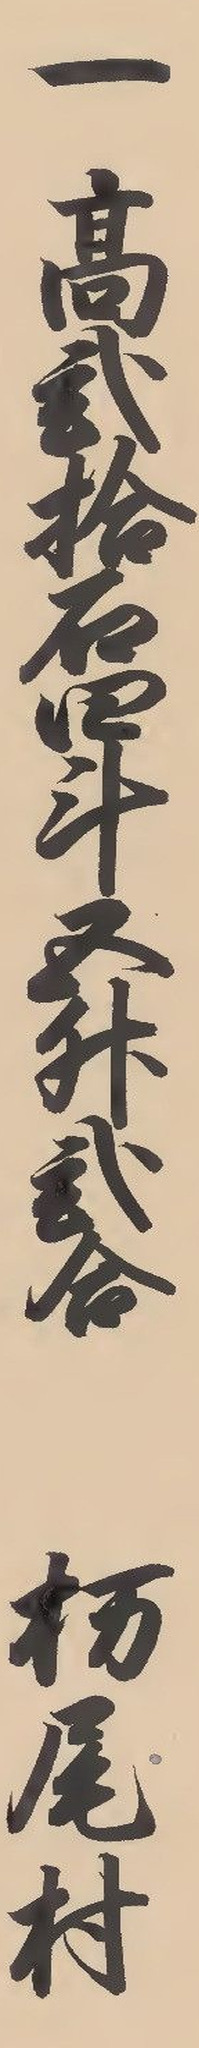一高弐拾石四斗五升弐合栃尾村
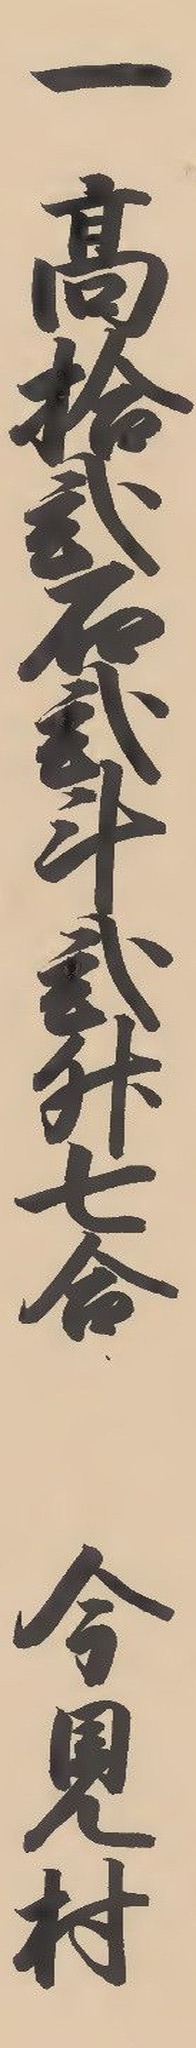一高拾弐石弐斗弐升七合今見村
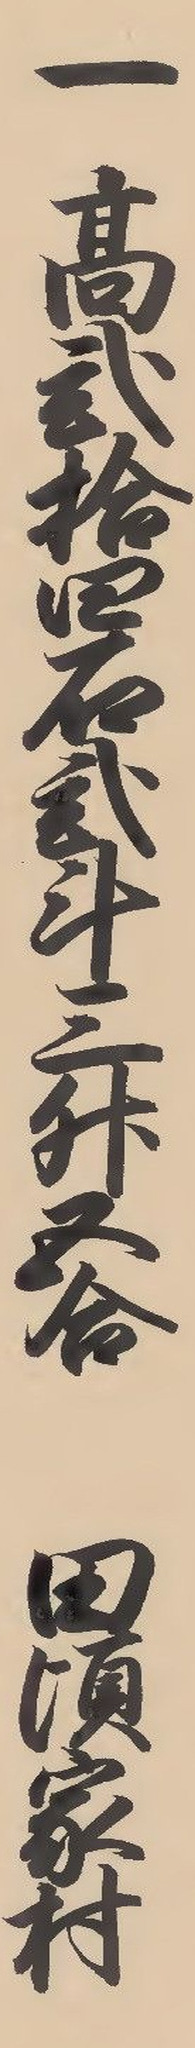一高弐拾四石弐斗三升五合田頃家村
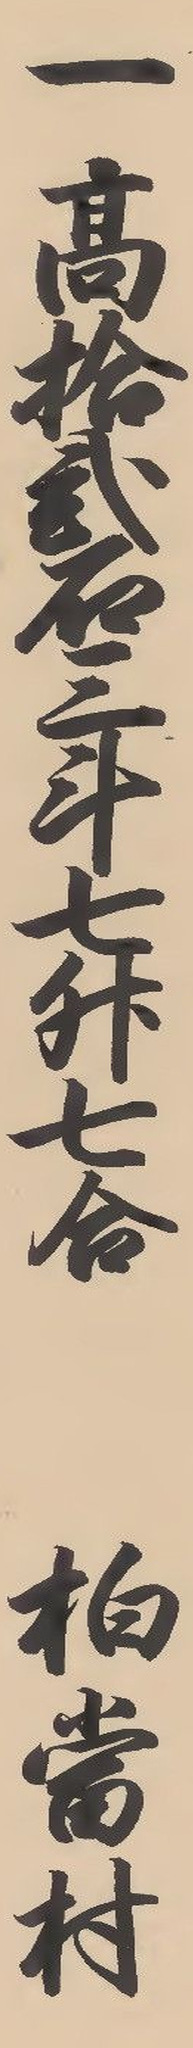一高拾弐石三斗七升七合柏当村
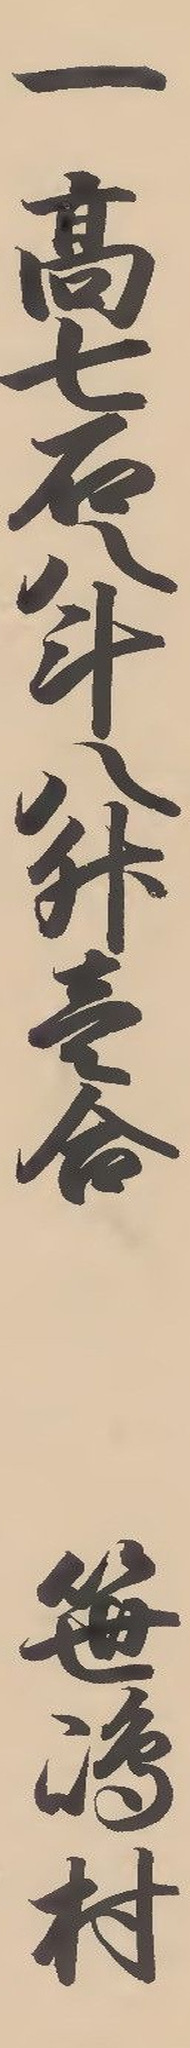一高七石八斗八升壱合笹島村
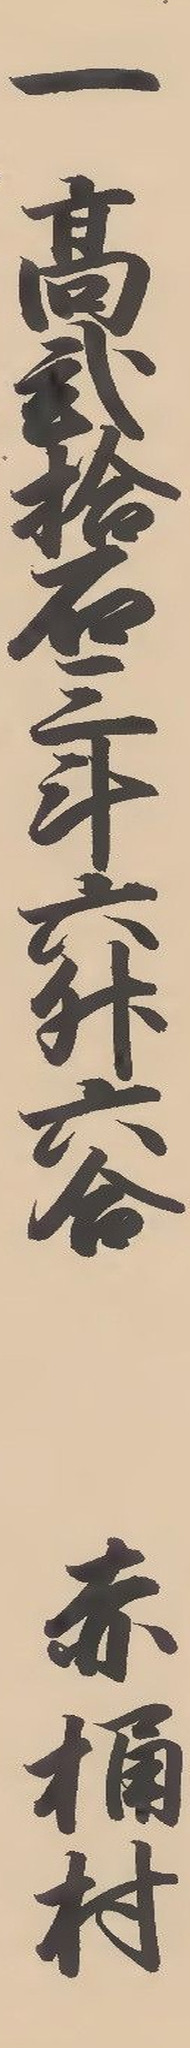一高弐拾石三斗六升六合赤桶村
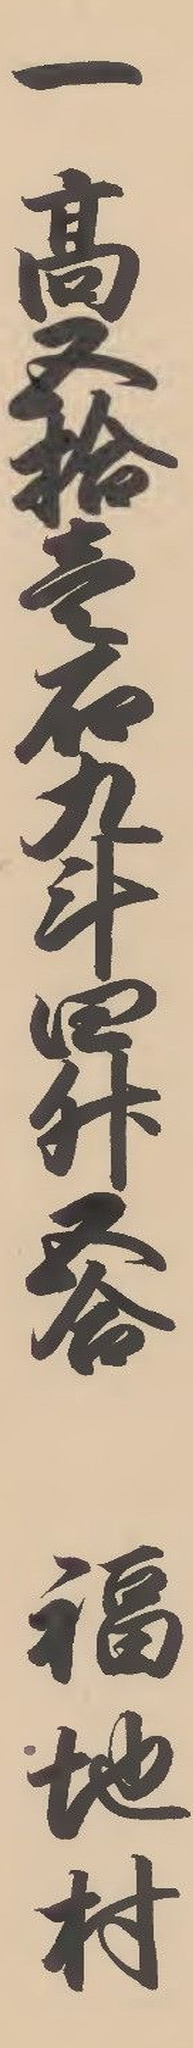一高五拾壱石九斗四升五合福地村

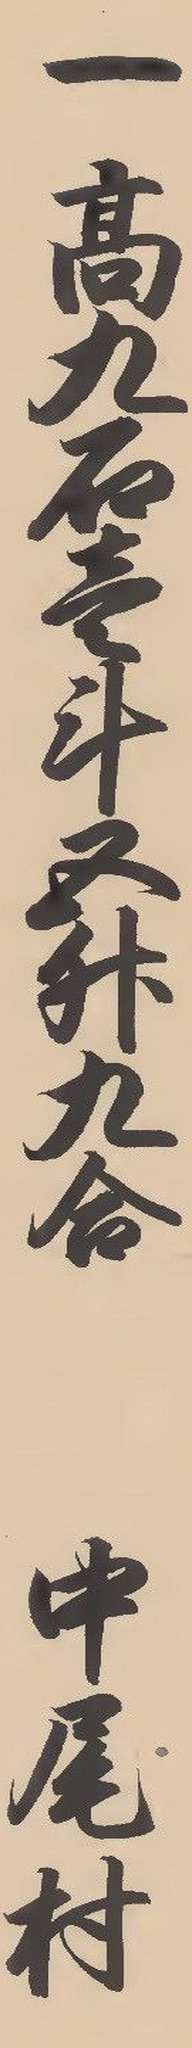一高九石壱斗五升九合中尾村
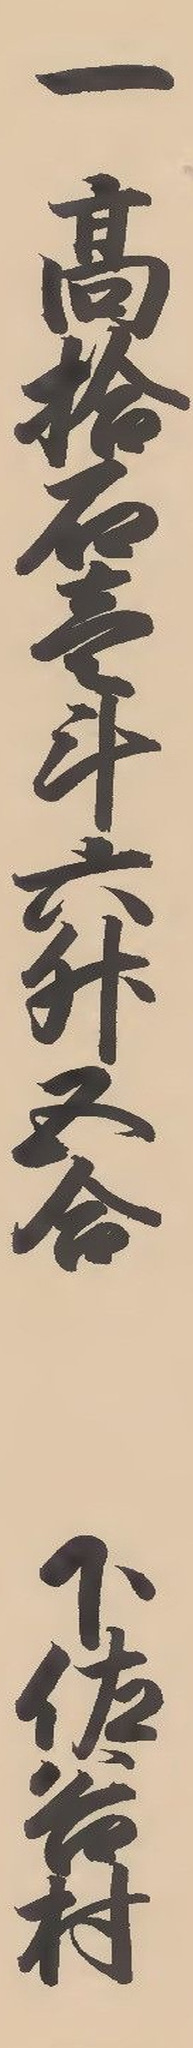一高拾石壱斗六升五合下佐谷村
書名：飛騨国郷帳
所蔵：国立公文書館 National Archives of Japan
